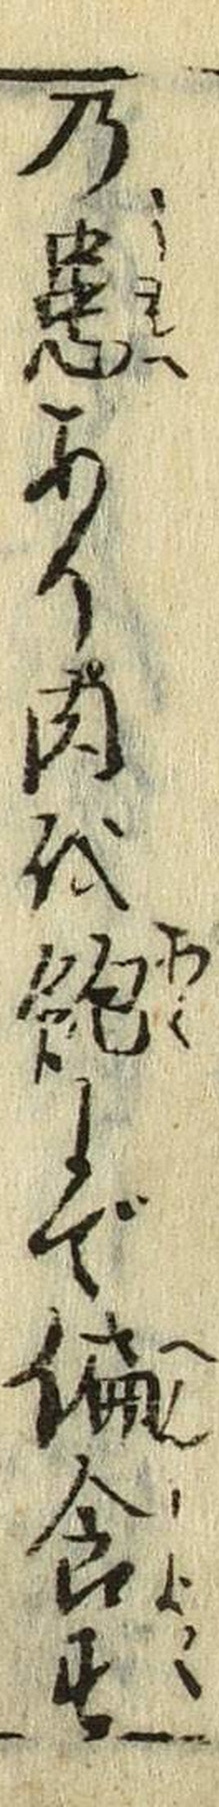の患あり肉を飽まで偏食す
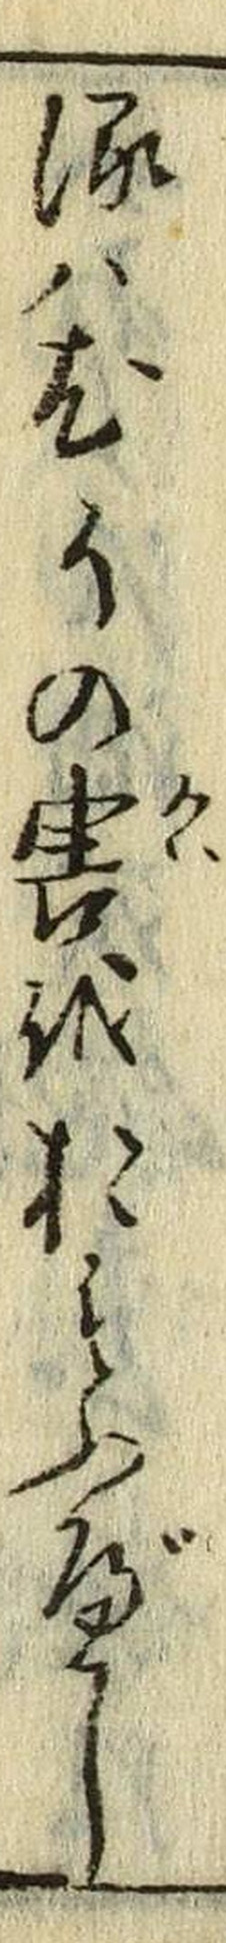るは尤その害をおもふべし
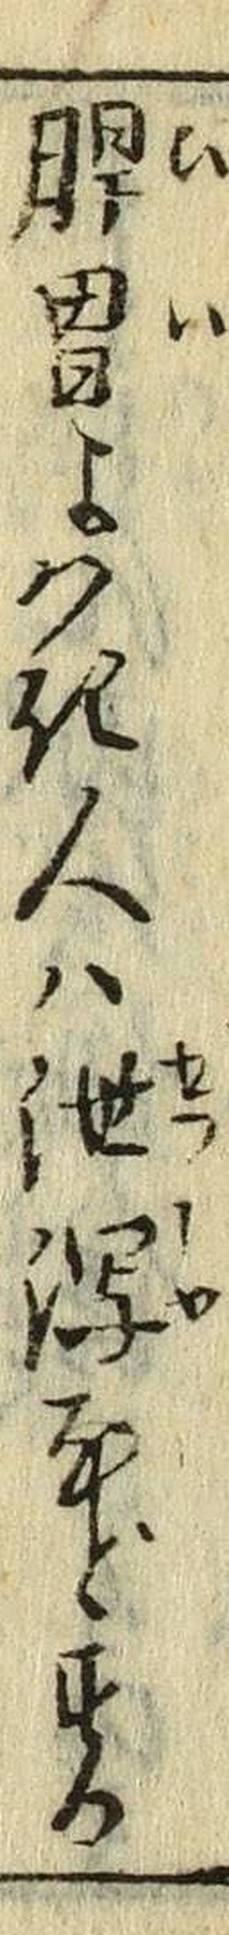脾胃よはき人は泄瀉などする
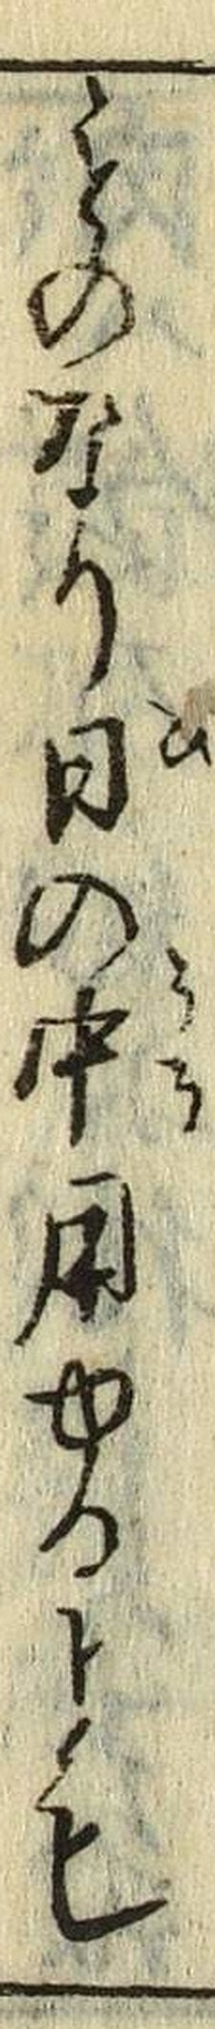ものなり日の中用ゆるし
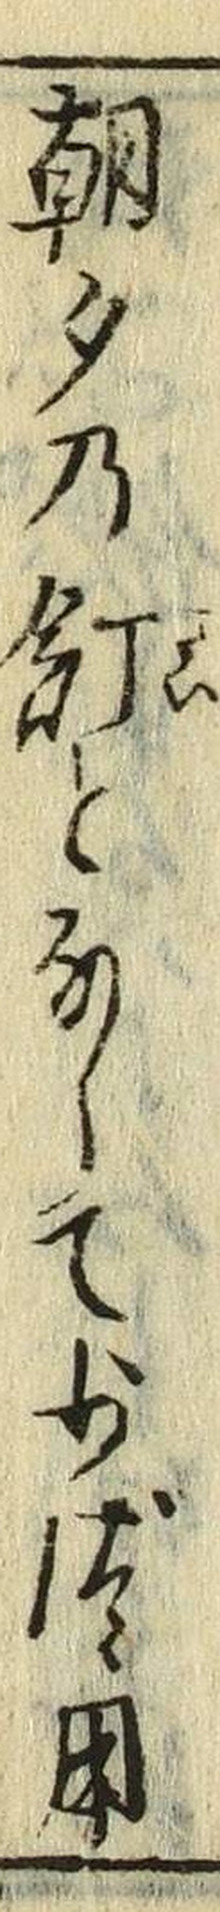朝夕の飣となして少づゝ用
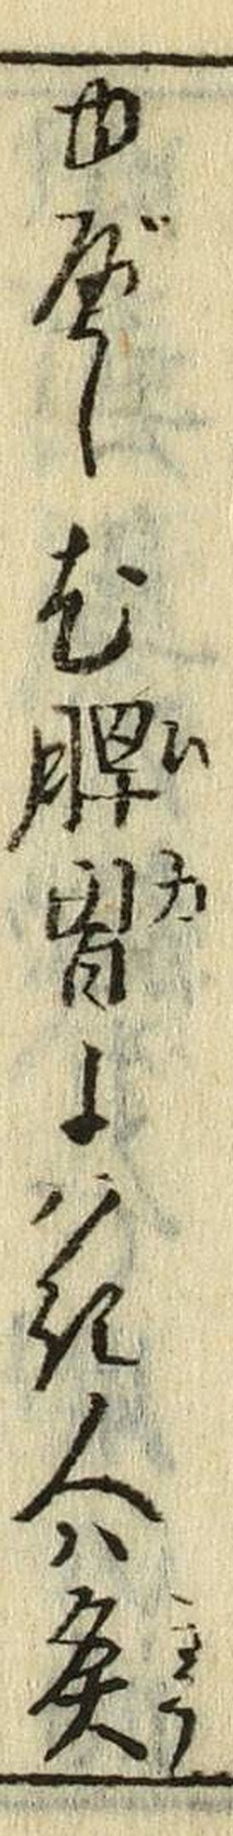ゆべし尤脾胃によはき人は灸
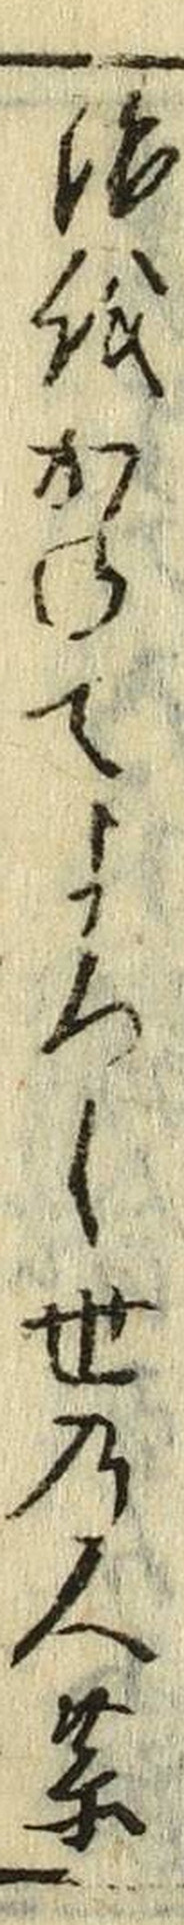治をかねてよろし世の人薬
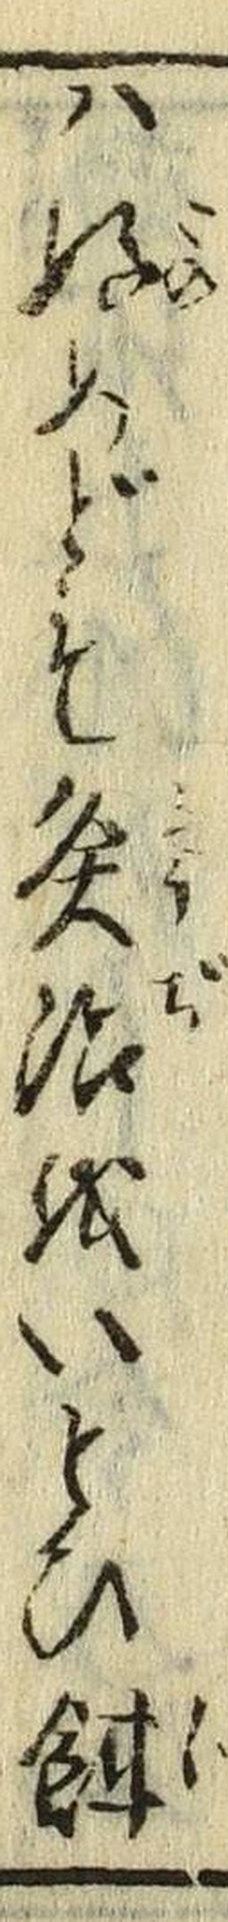は好めども灸治をいとひ餌
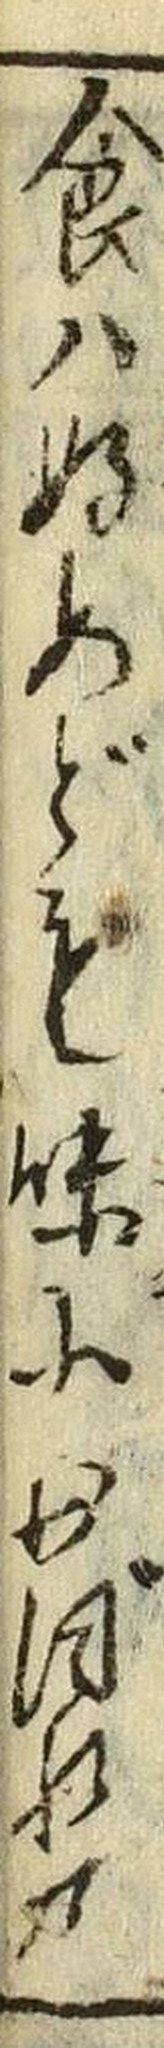食は好めども味におぼれて
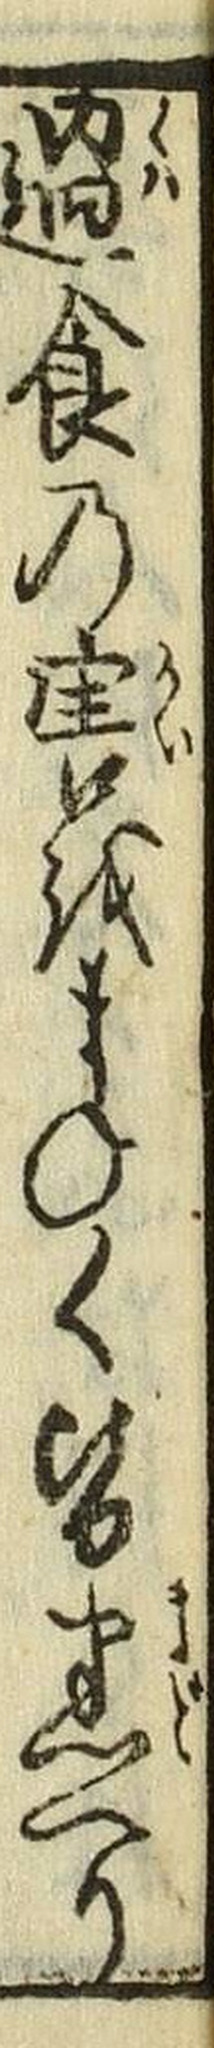過食の害をまねく皆迷へり
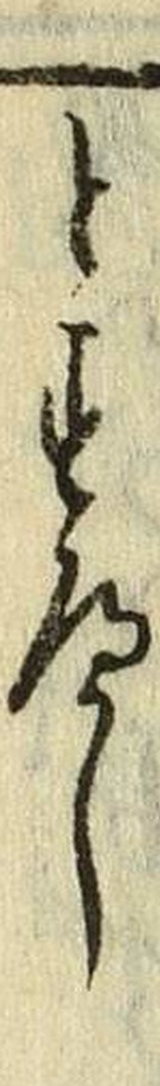とすへし
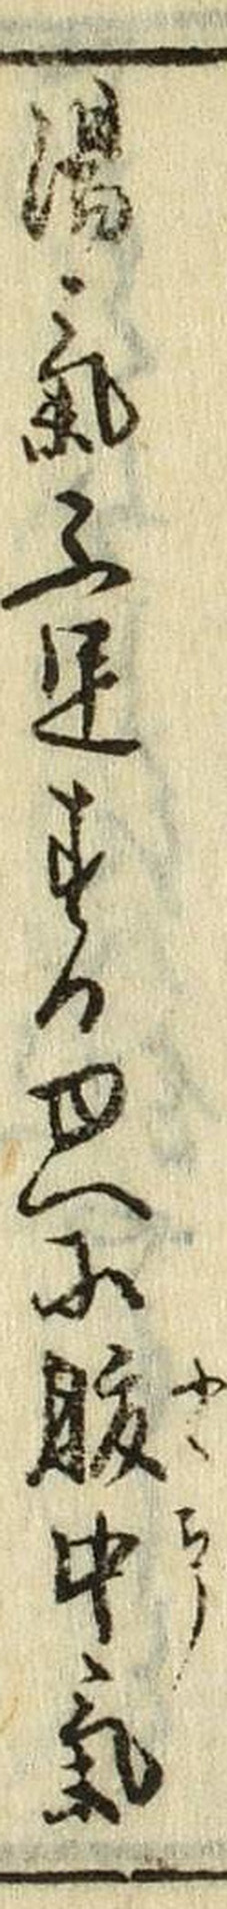陽気不足するゆへに腹中気
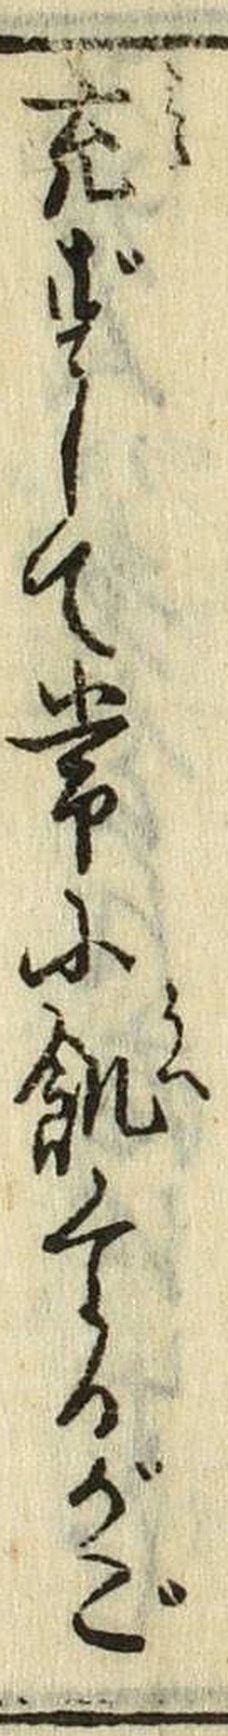充ずして常に飢たるがご
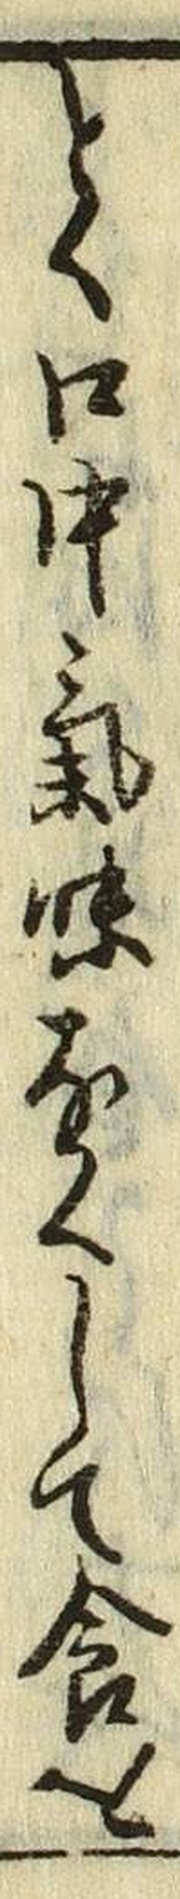とく口中気味なくして食を
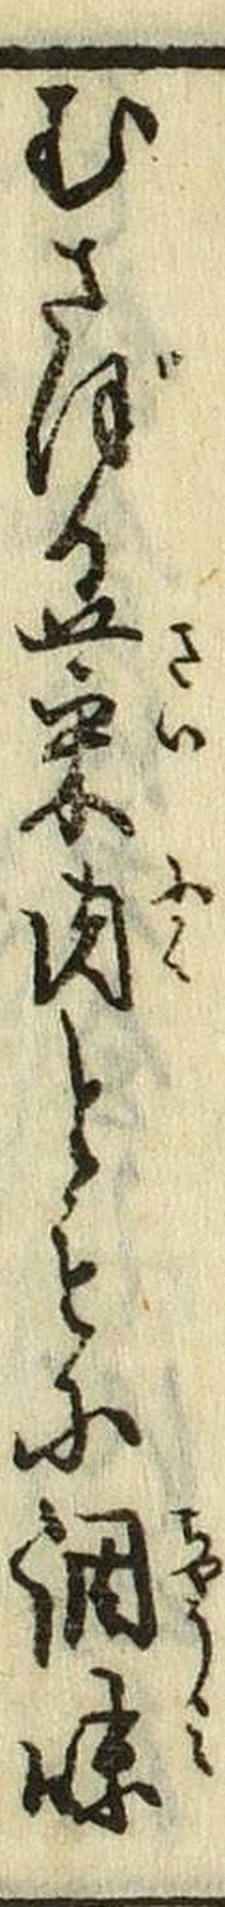むさぼる菜肉ともに調味
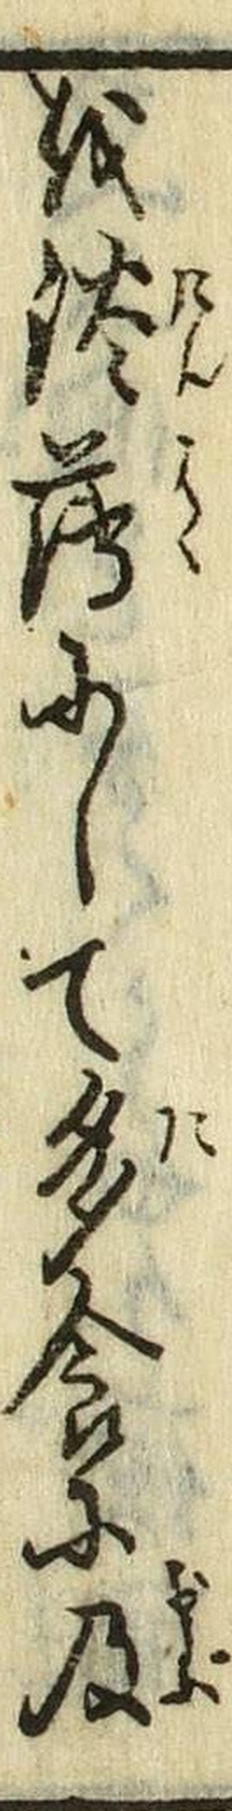を淡薄にして多食に及
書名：居家養生記
